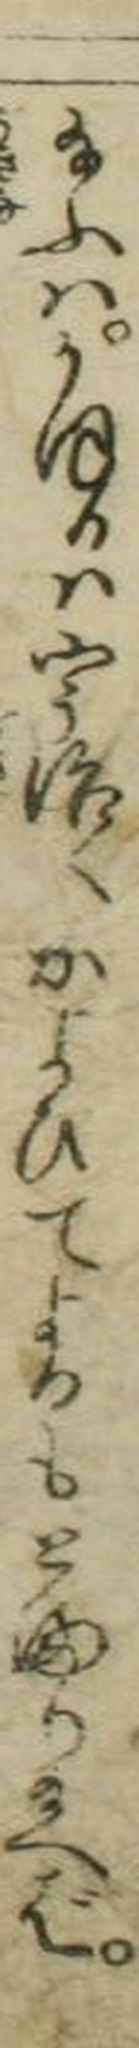給ふは。かほるは宇治へかよひてよるもとまり給へば。
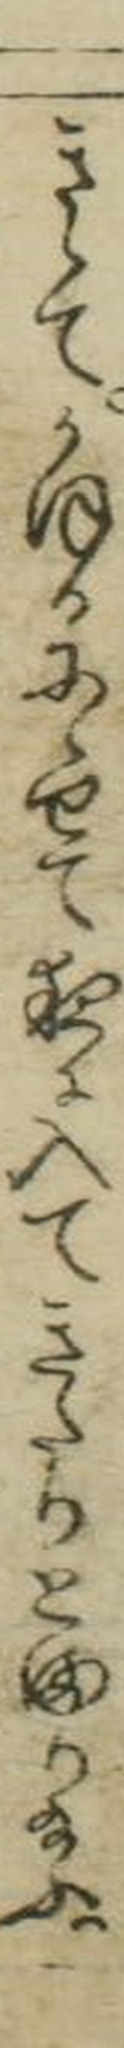きゝて。かほるにゝせて夜に入てきたりとまり給ふ。
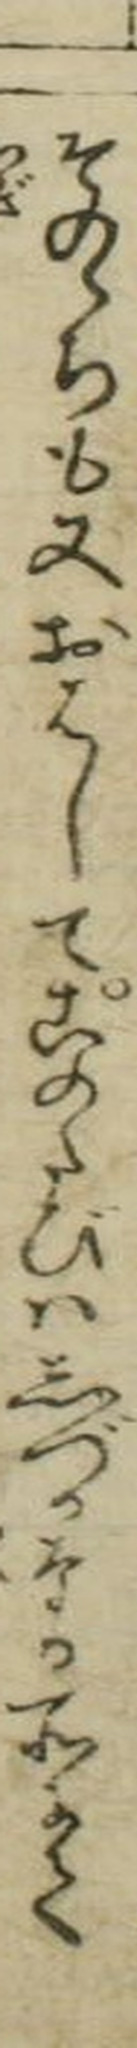そのゝちも又おはして。このたびはしづかなる所にて
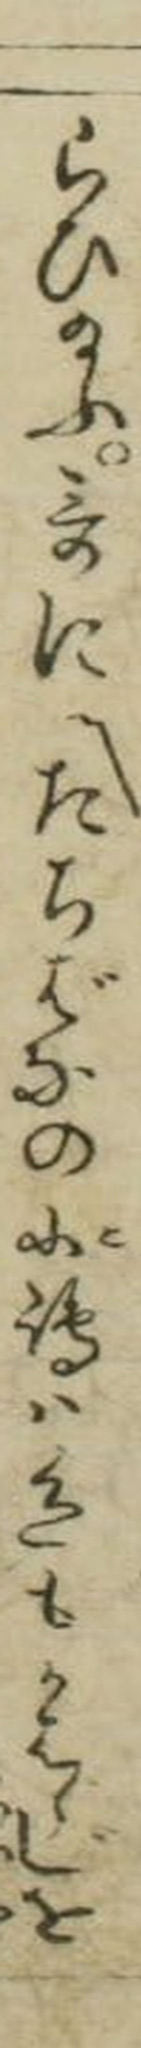らひ給ふ。哥に〽たちばなの小島は色もかはらじを
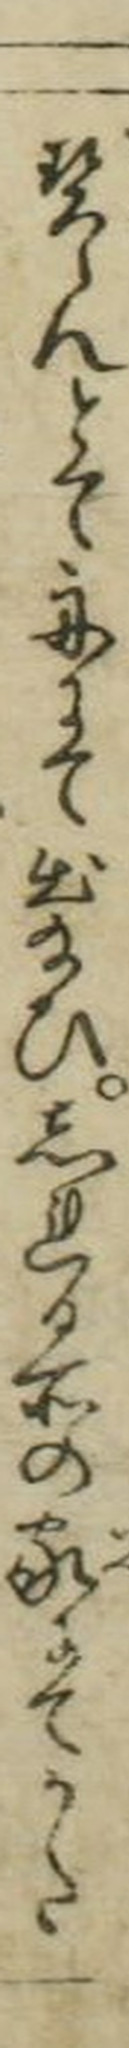契らんとて舟にて出給ひ。しれる所の家にてかた
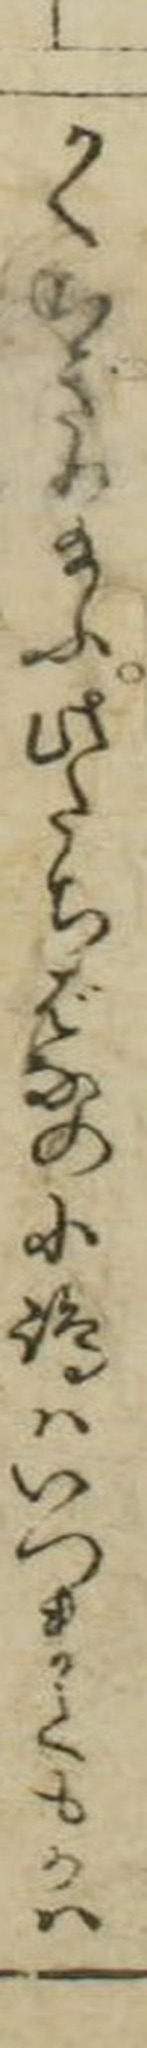かくちぎり給ふ。此たちばなの小島はいつまてもかは
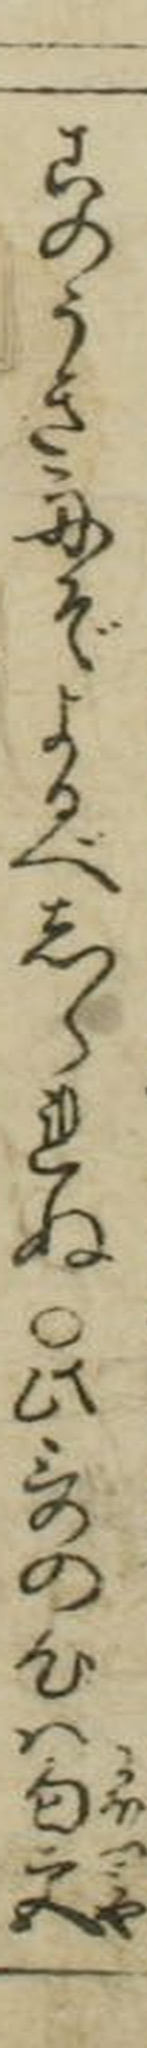このうき舟ぞよるべしられぬ◯此哥の心は匂宮
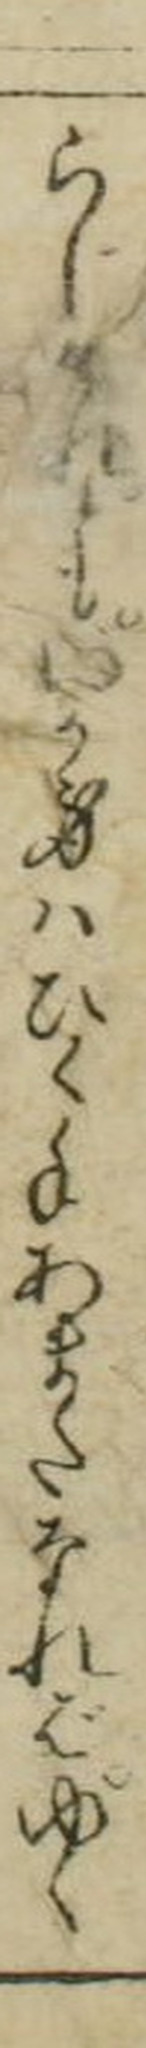らじけれども。わか身はひく手あまたなれば。ゆく
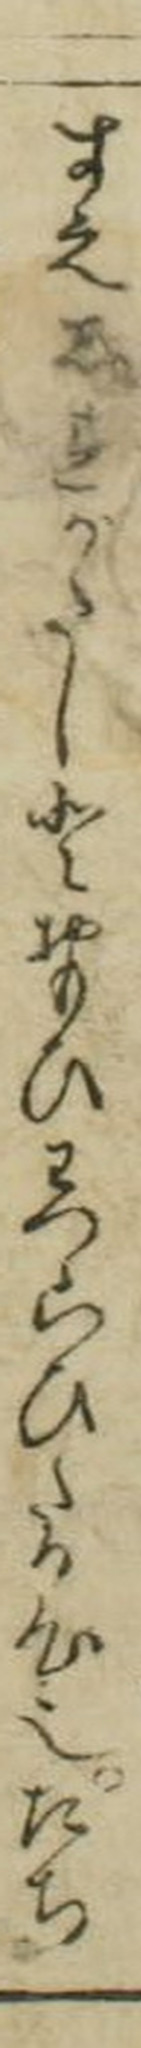すえしれがたしとおもひわつらひたる心也。たち
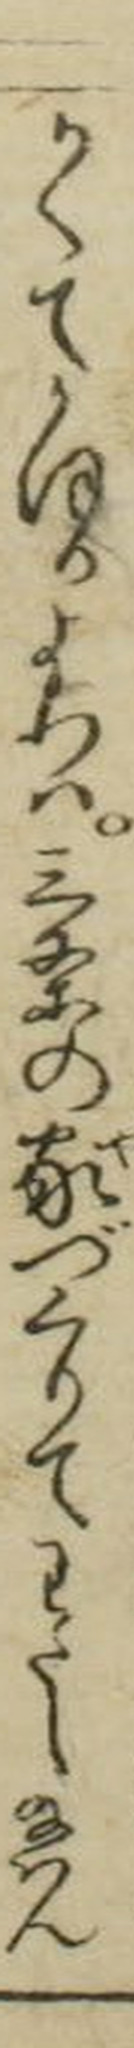かくてかほるよりは。三条の家づくりてわたし給はん
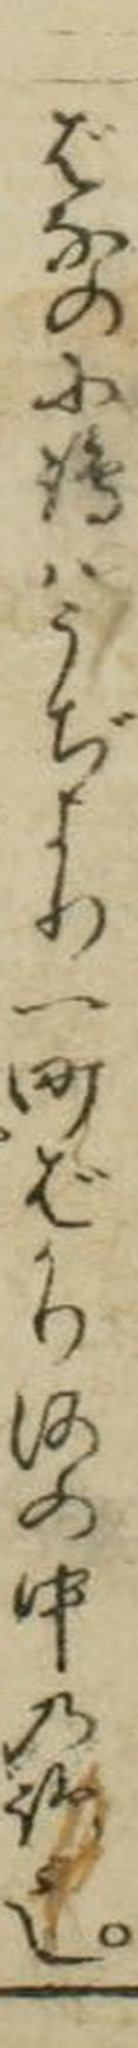ばなの小島はうぢより一町ばかり河の中の島也。
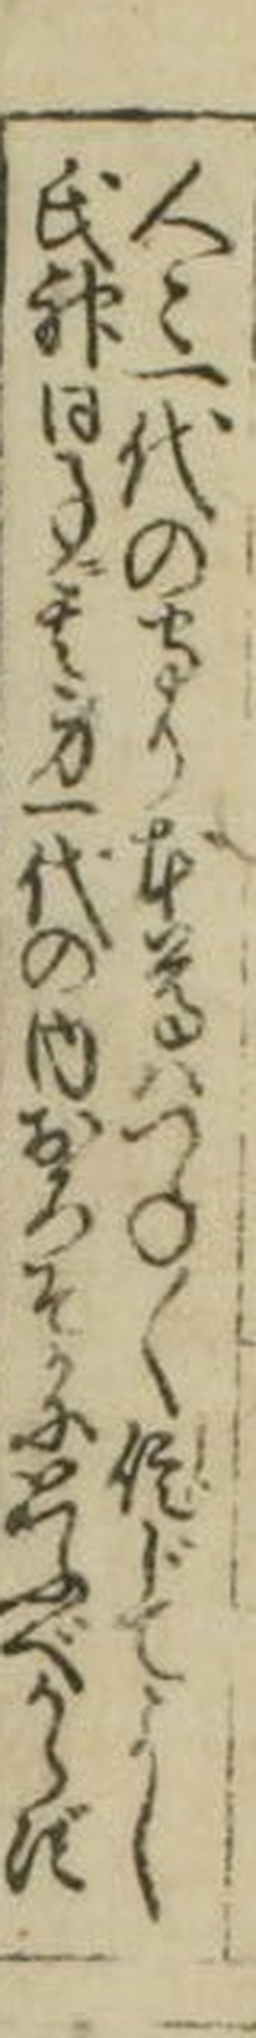氏神は事に其身一代の内おろそかに思ふべからず
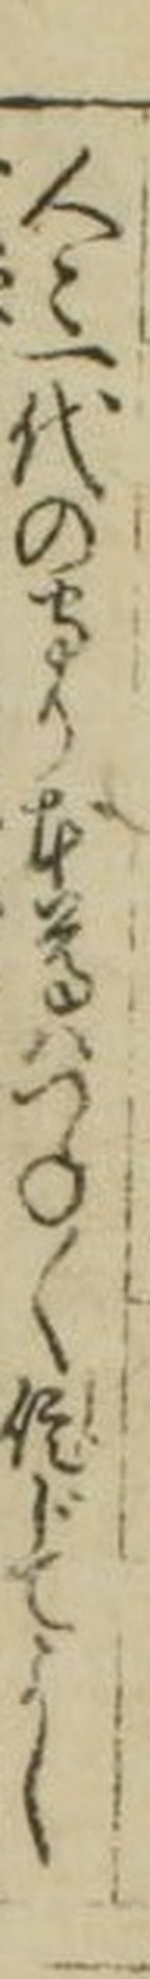人々一代の守り本尊はつね〳〵信じてよし
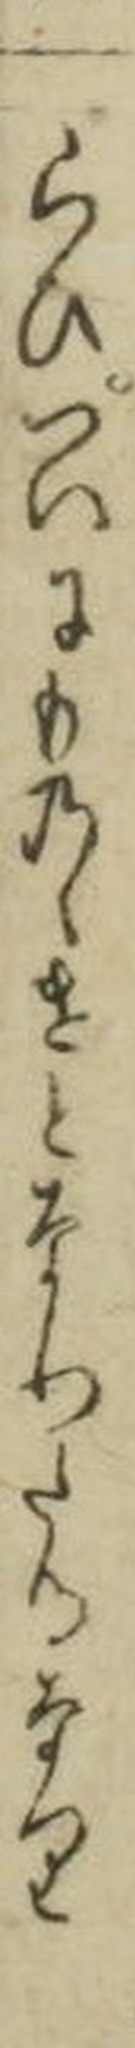らひ。ついにものゝけとなりたるなり
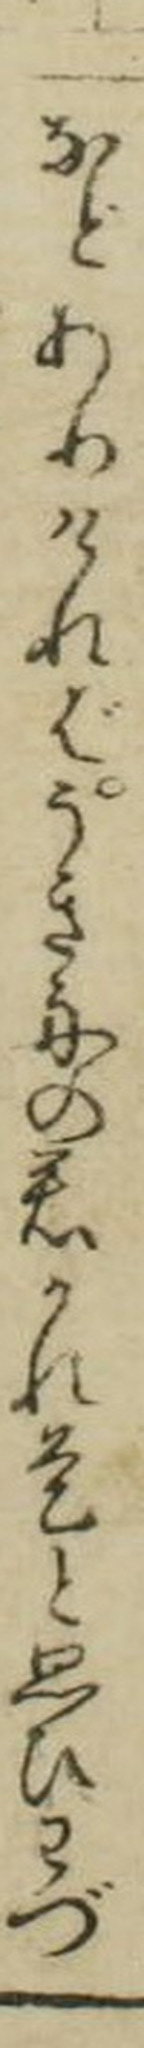などありければ。うき舟の君かれ是と思ひわづ
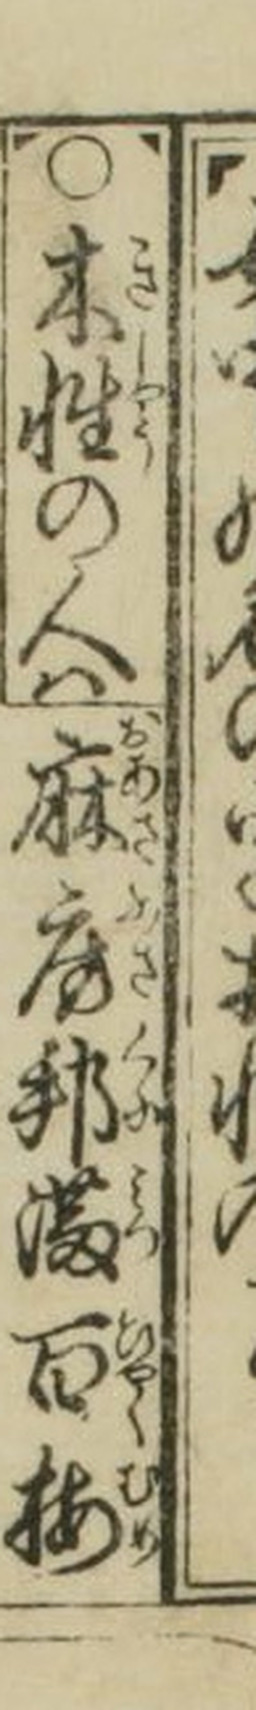◯木性の人は麻房邦満百梅
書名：女源氏教訓鑑
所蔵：東京学芸大学附属図書館
